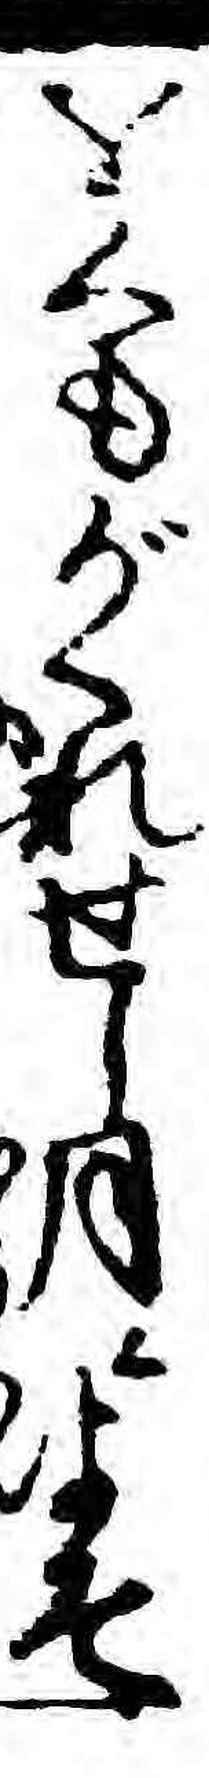をくもがくれせし月によそ
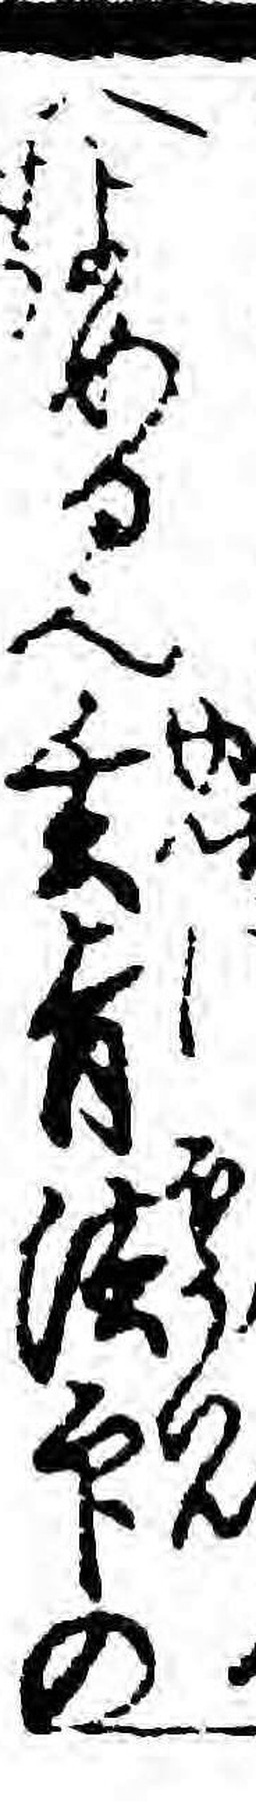へよめる也玄旨法印の
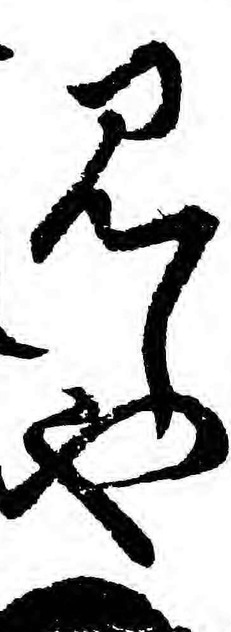見しや
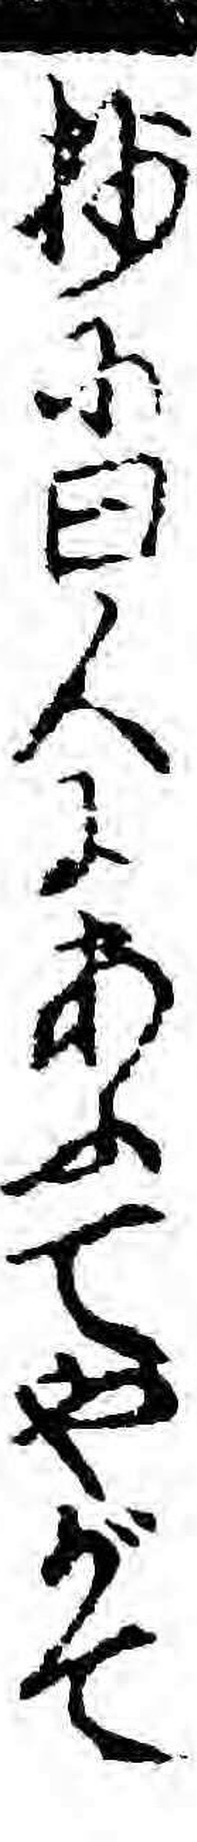抄に曰人にあふてやがて
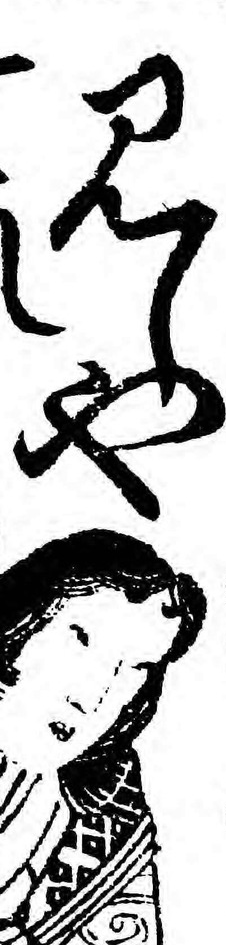見しや
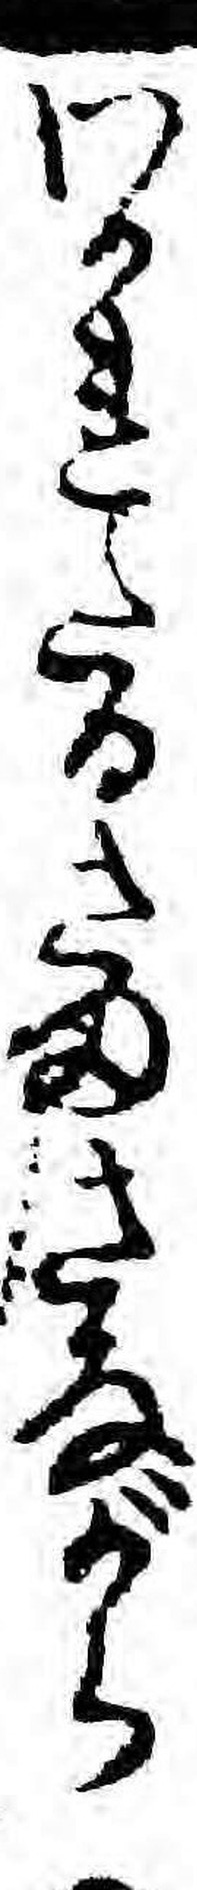わかれたるさまさながら
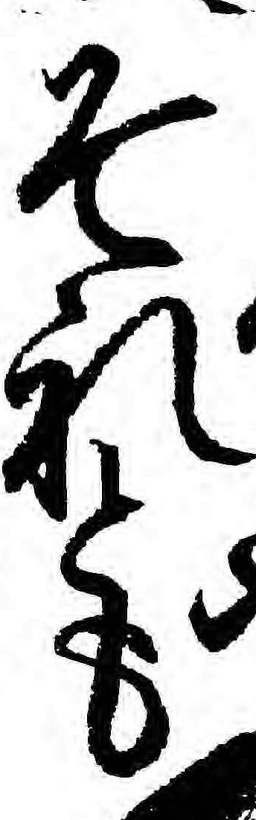それとも
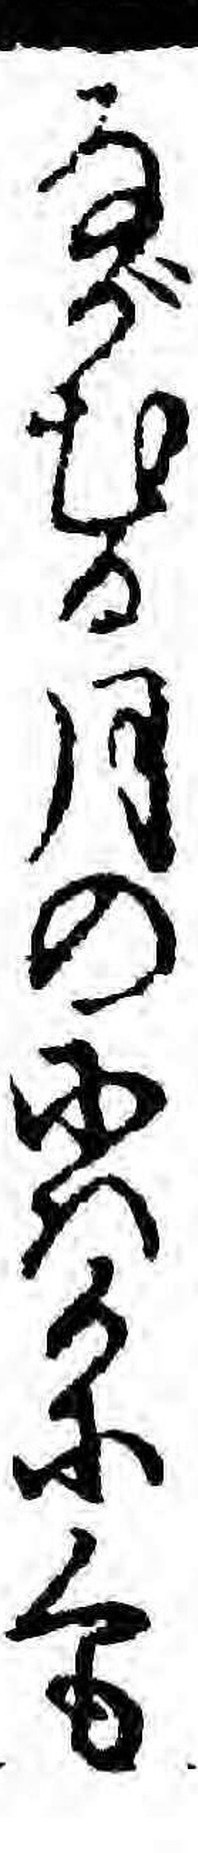ながむる月のにはかにくも
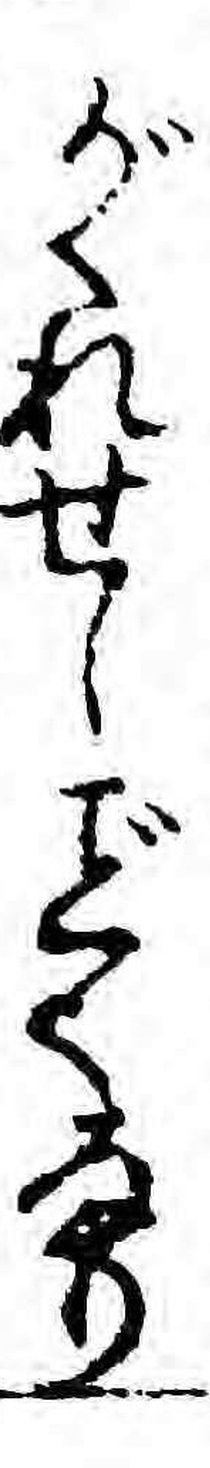がくれせしごとくなり
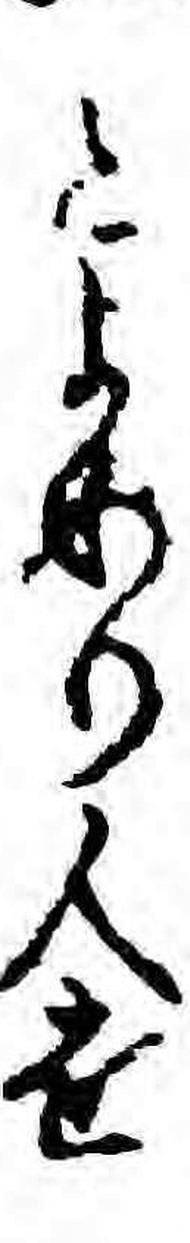とよめり人を
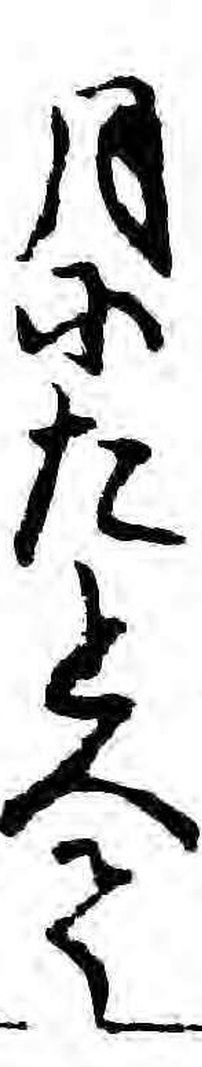月にたとへて
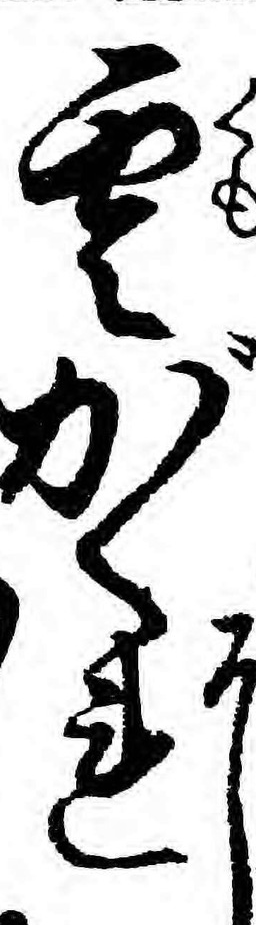雲がくれ
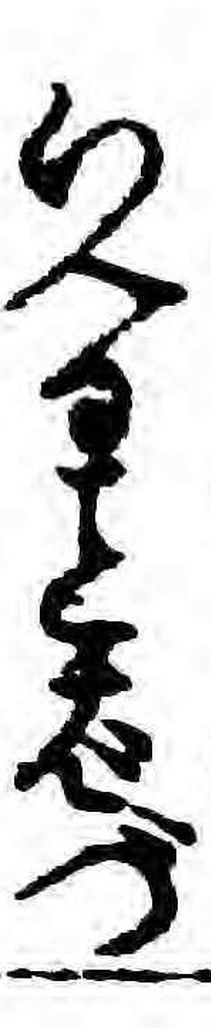いへることばづ
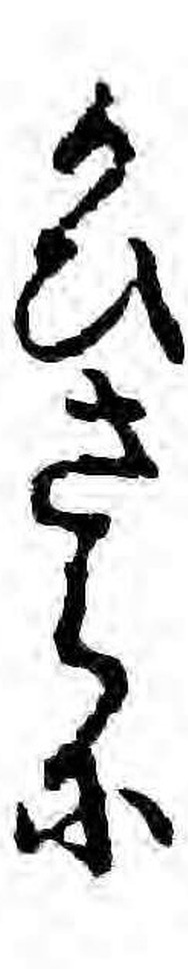かひさらに
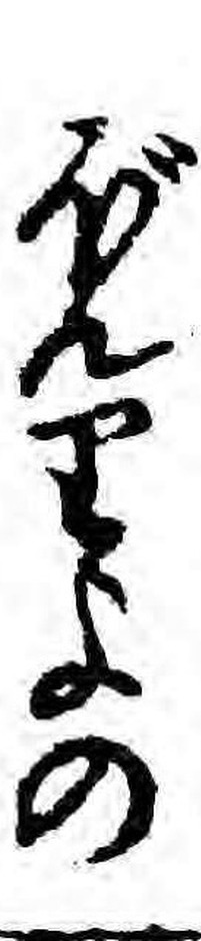ぼんりよの
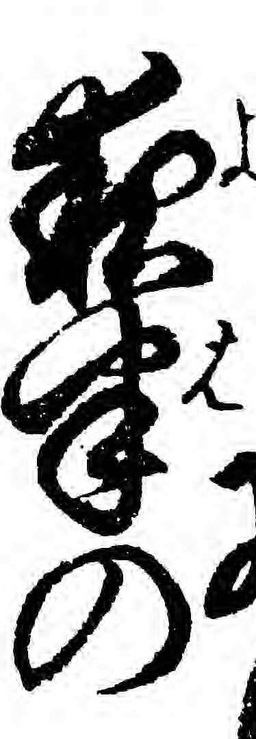夜半の
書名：頭書和歌注譯／壽賀多百人一首小倉錦
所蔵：国文学研究資料館
